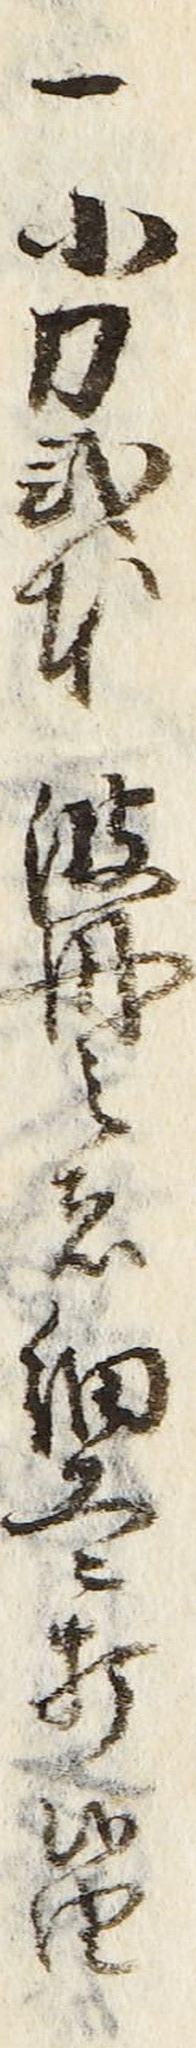一小刀弐本波丹之者細工ニ打候由
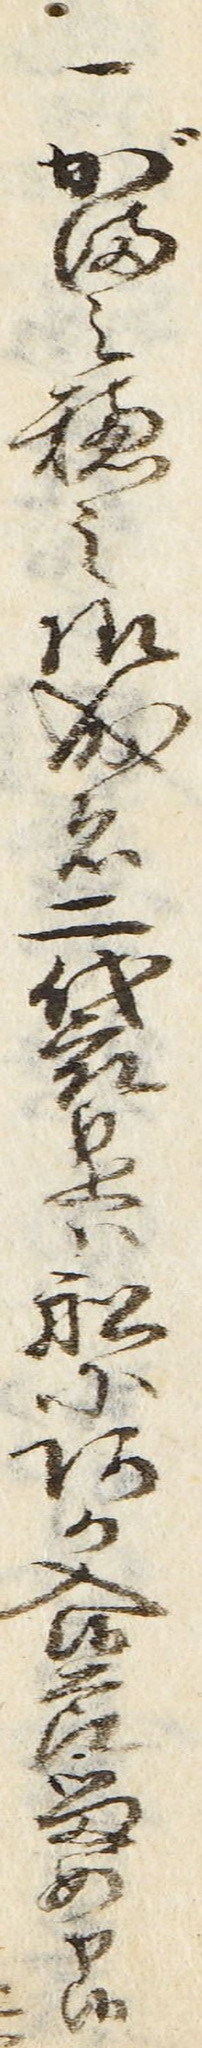一がま之穂之様成者二袋是ハ船にあか入候節留め申候ため
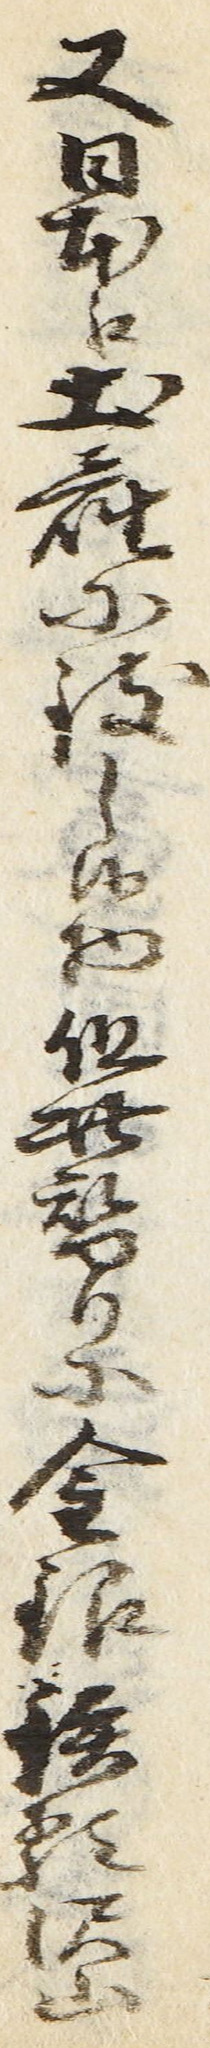又日本江土産に致し候物但此替りに金銀鉄類沢山
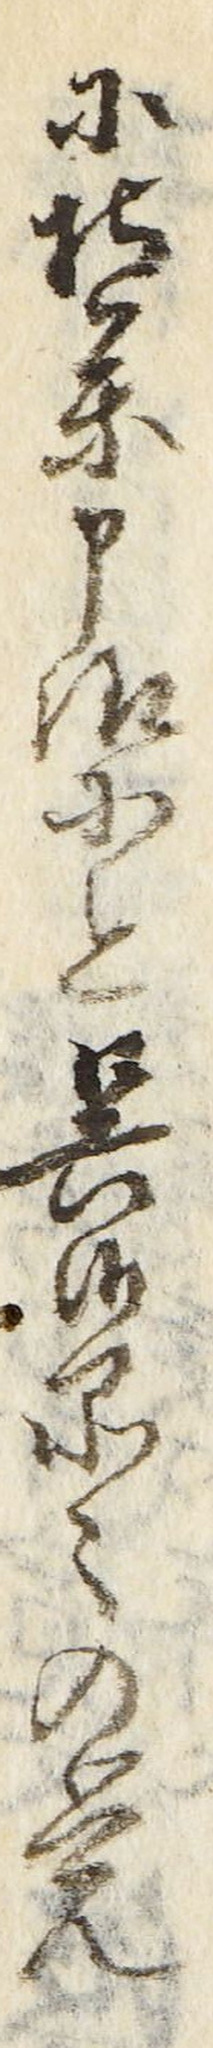に持参申様にと呉候品々の覚
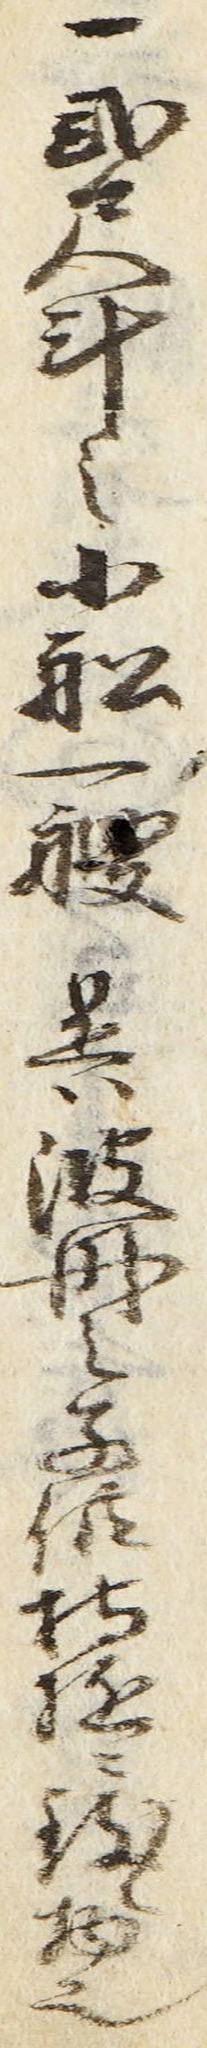一弐尺計之小船一艘是ハ波丹之子供持遊ニ致し物也
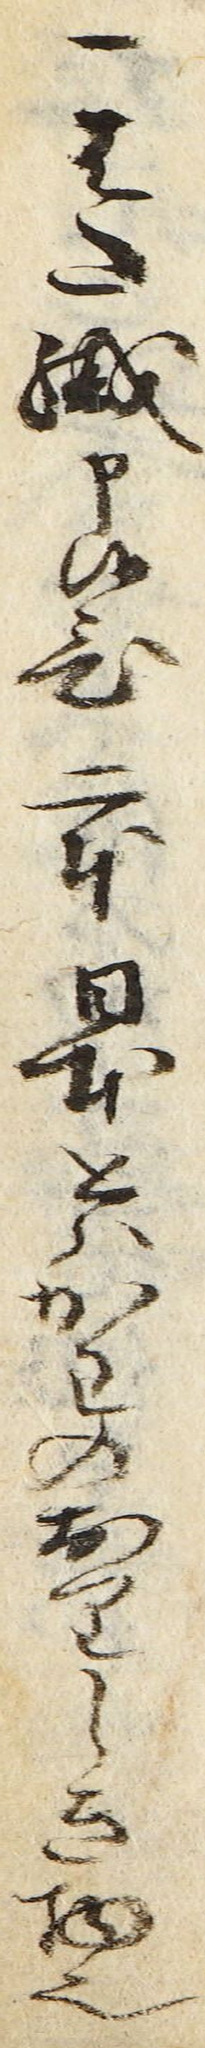一はた織申候ひ二本日本とハかわのおりしき物也

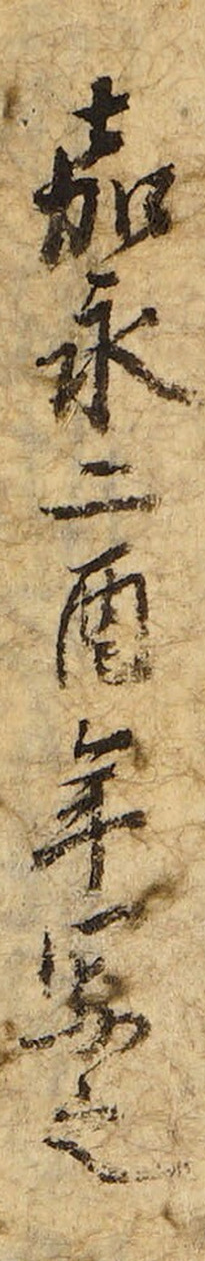嘉永二酉年写之
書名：波丹国漂流人覚書
